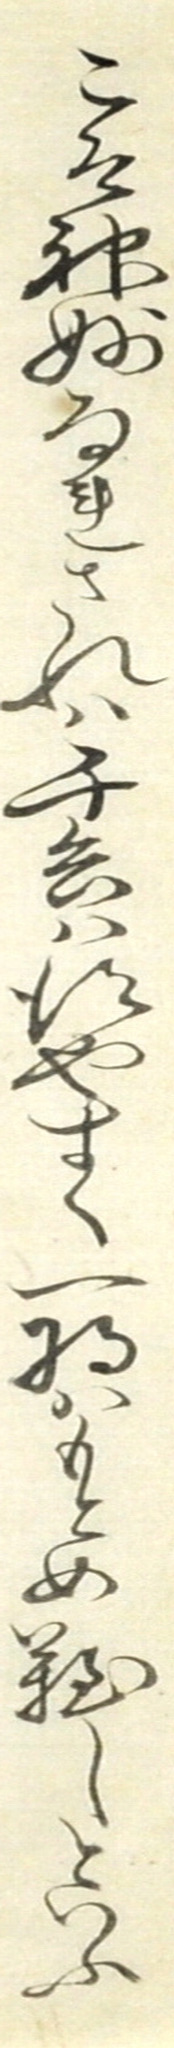こそ神妙なれされは千兵は得やすく一将はもとめ難しといふ
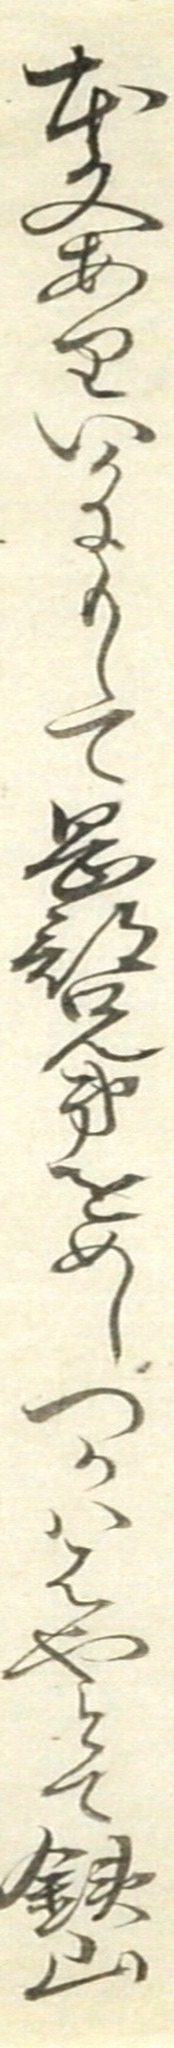本又ありいかにもして岡部兄弟をめしつかははやとて鉄山
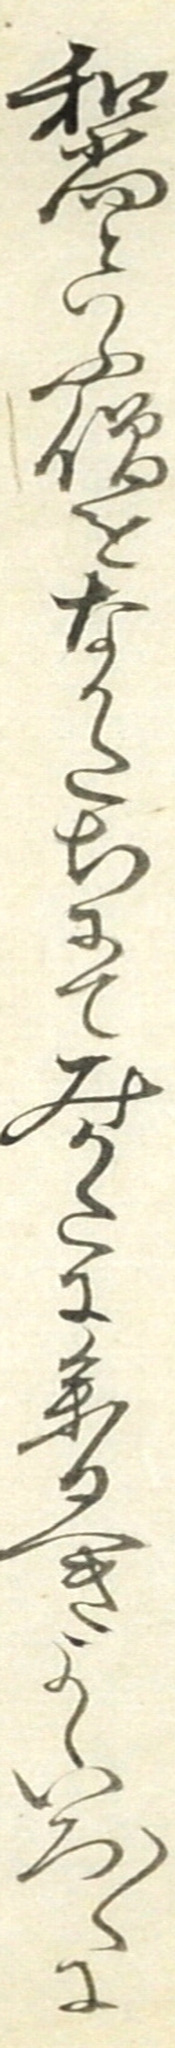和尚といふ僧をなかたちにてみかたに参るへきよしいろ〳〵に
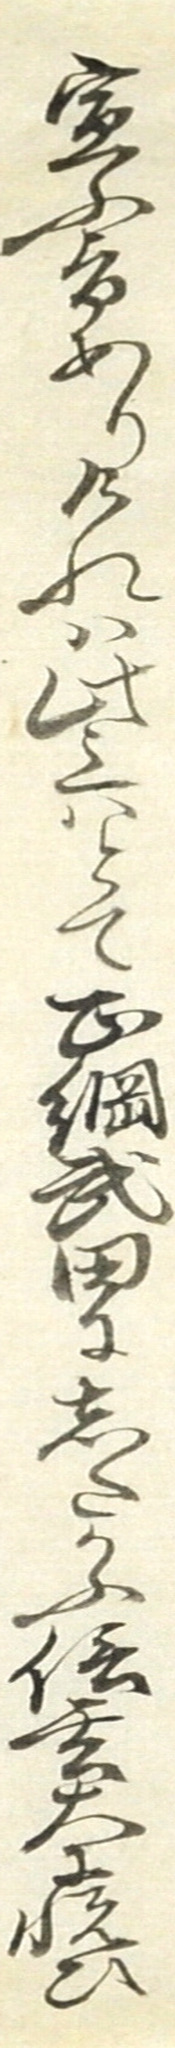宣ふ旨ありけれは此上はとて正綱武田にしたかふ信玄大に悦ひ
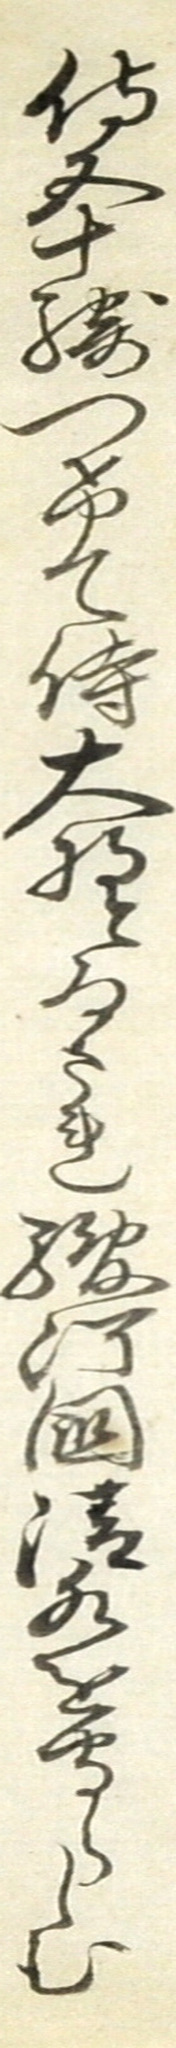侍五十騎つけて侍大将となされ駿河国清水を守らしむ
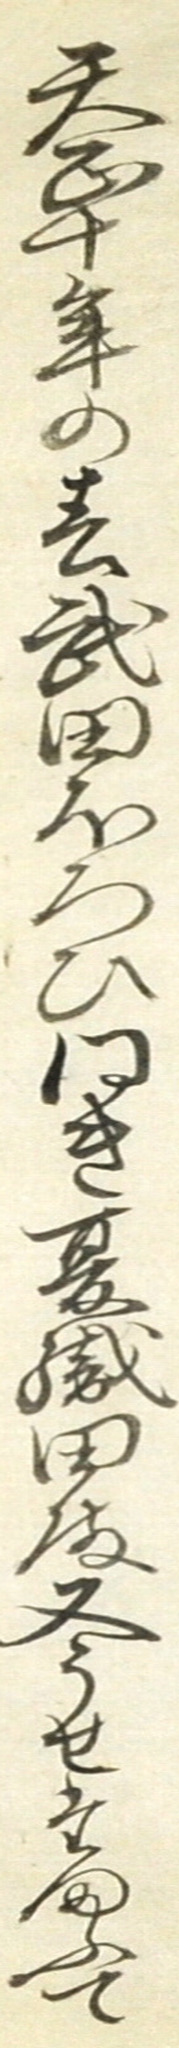天正十年の春武田ほろひ同き夏織田殿又うせたまふて
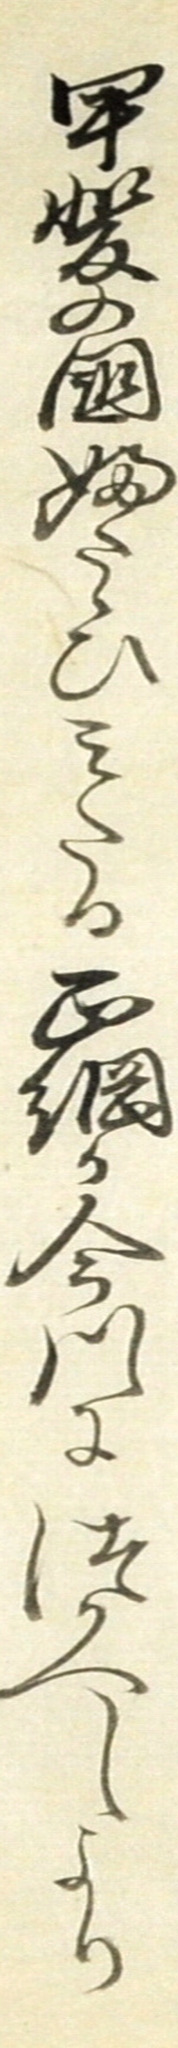甲斐の国ふたゝひみたる正綱か今川につかへしより
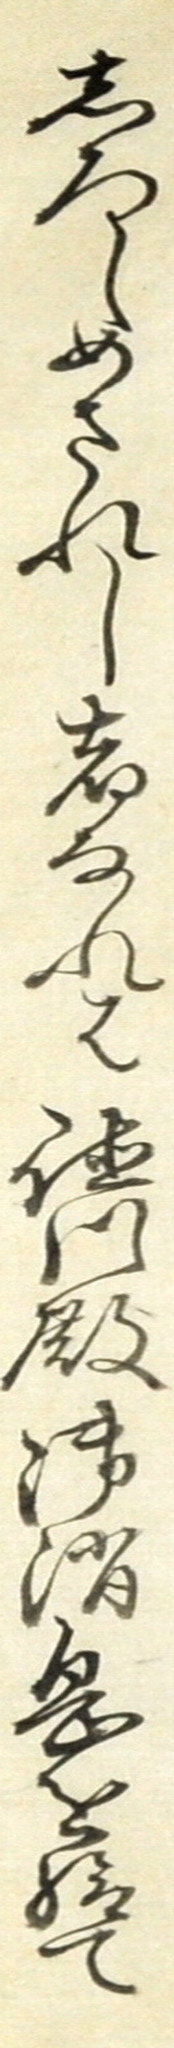しろしめされし者なれは徳川殿御消息を給て
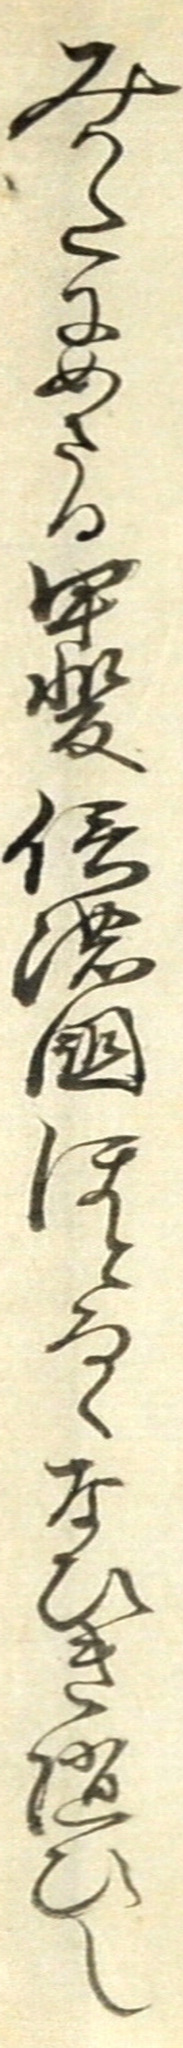みかたにめさる甲斐信濃国ほとなくなひき随ひし

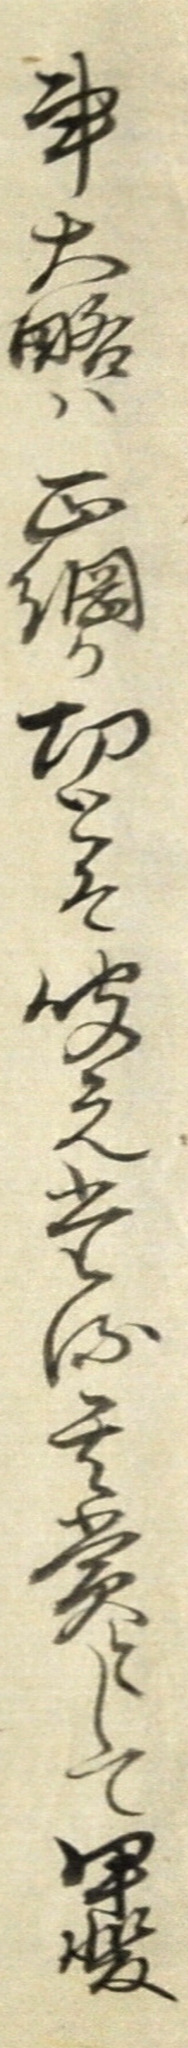事大略は正綱か功とそ聞えたる其賞として甲斐
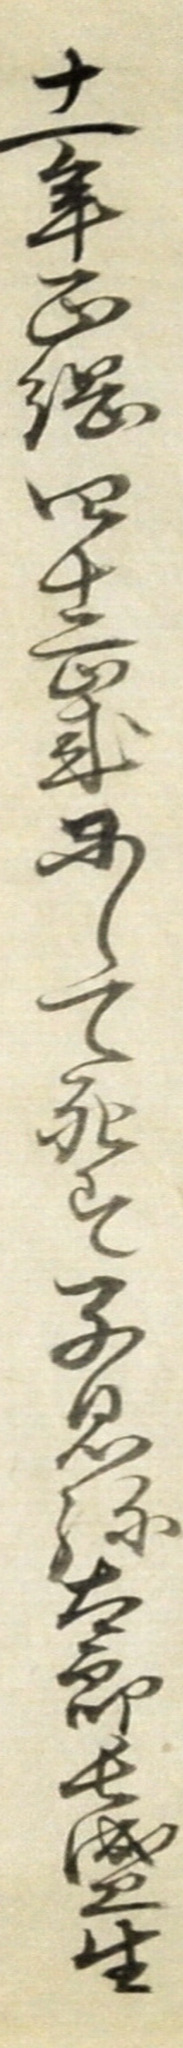十一年正綱四十二歳にして死す子息弥太郎長盛生
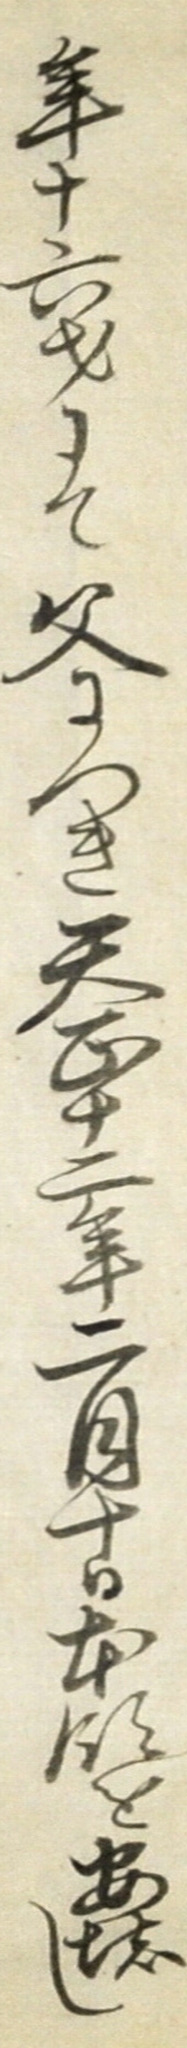年十六才にて父につき天正十二年二月十日本領を安堵し
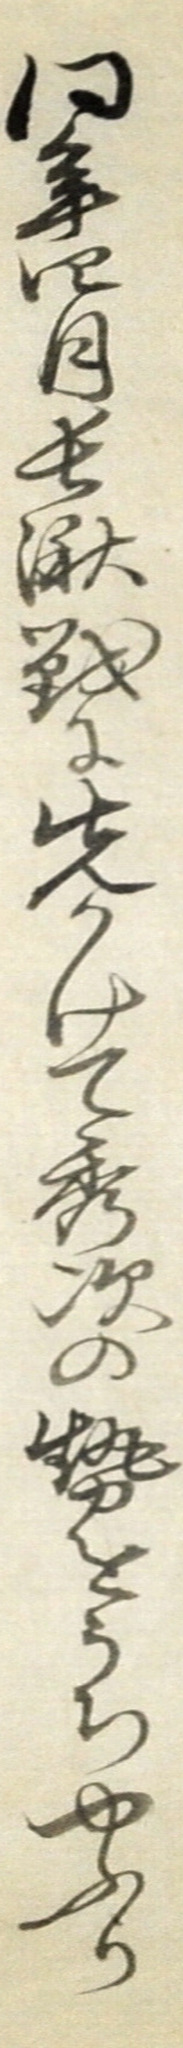同年四月長湫戦に先かけて秀次の勢をうちやふり
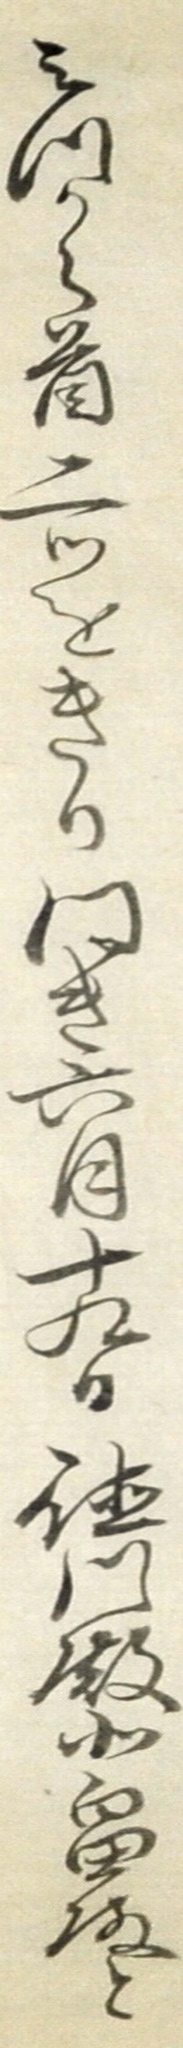みつから首二ツをきり同き六月十九日徳川殿北畠殿と
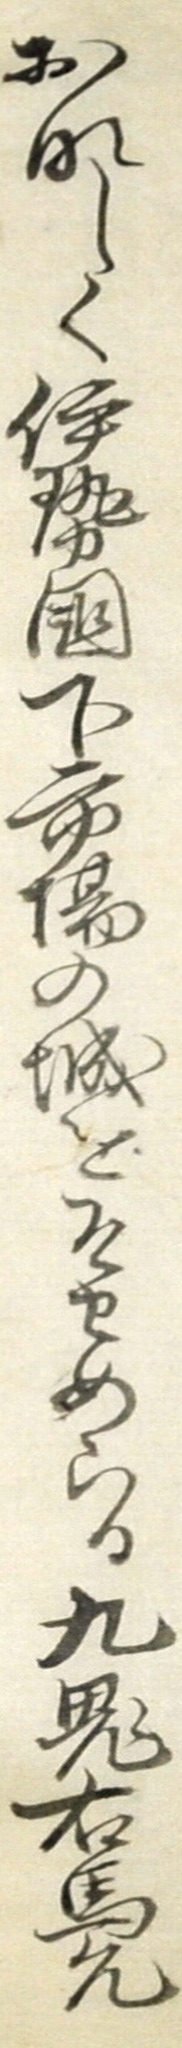おなしく伊勢国下市場の城をそせめらる九鬼右馬允
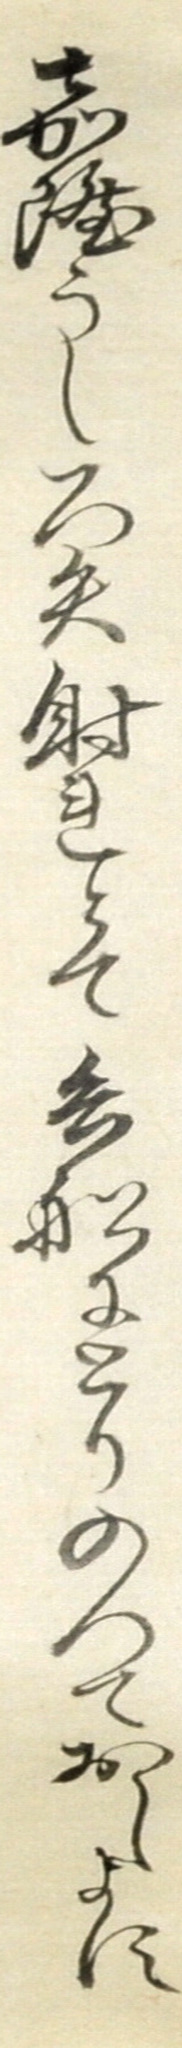嘉隆うしろ矢射れとて兵船にとりのつておしよす
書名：藩翰譜（六）
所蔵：伊那市立高遠町図書館・合同会社AMANE
